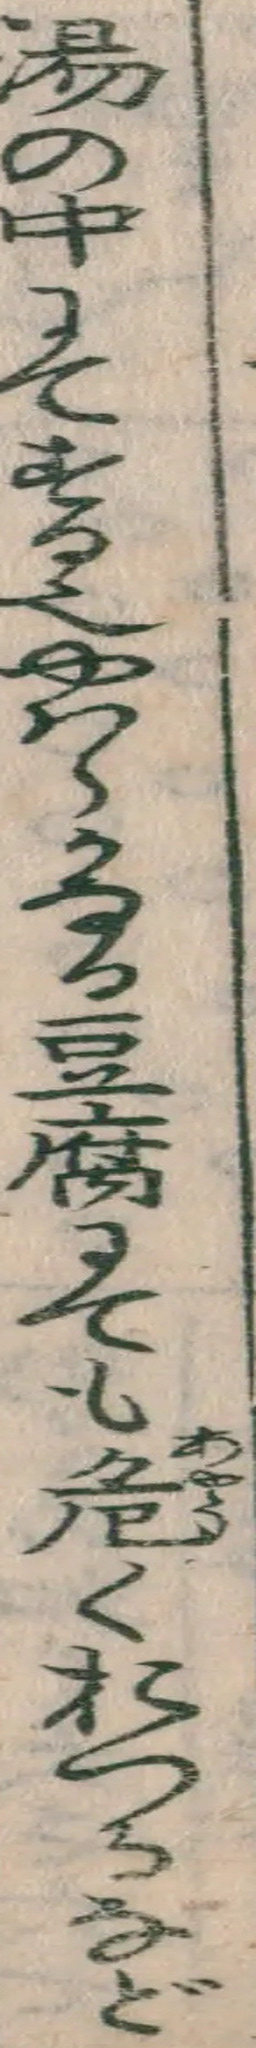湯の中にてする也やはらかなる豆腐にても危くおつるなど
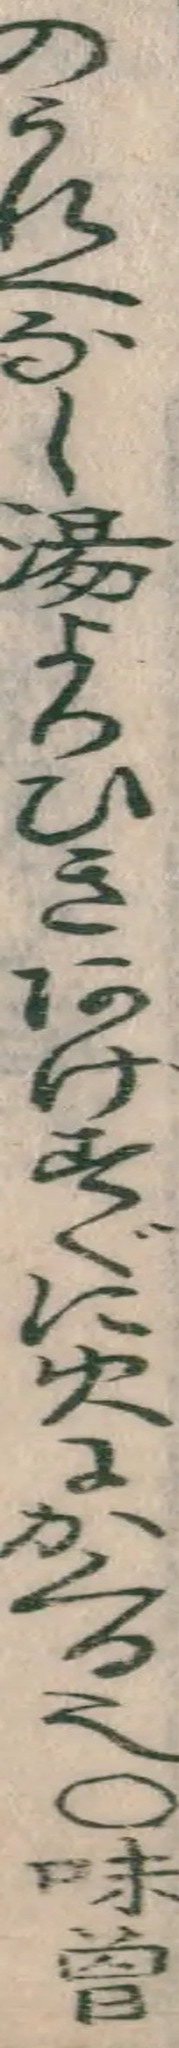のうれへなし湯よりひきあげすぐに火にかくる也○味噌
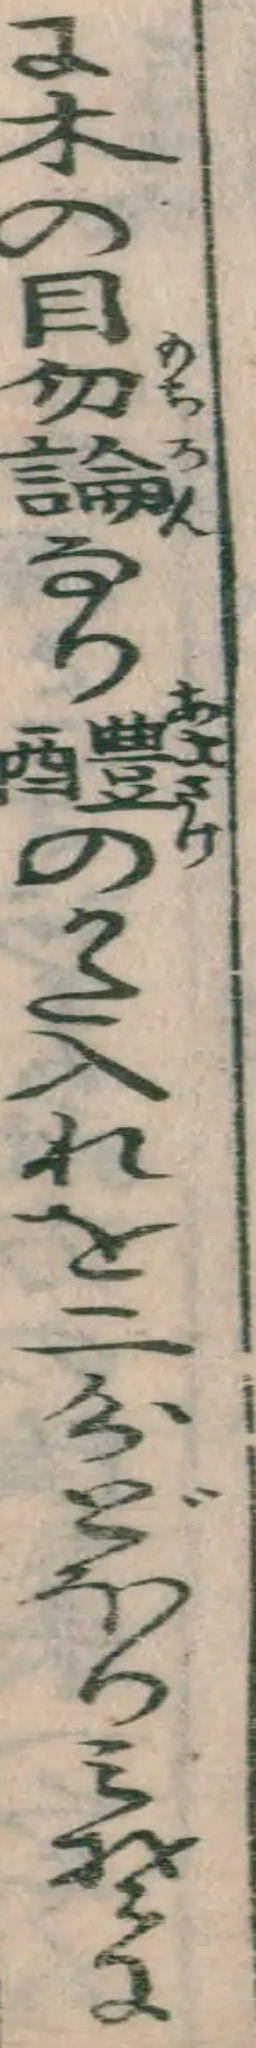に木の目勿論なり醴のかた入れを二分どほりみそに
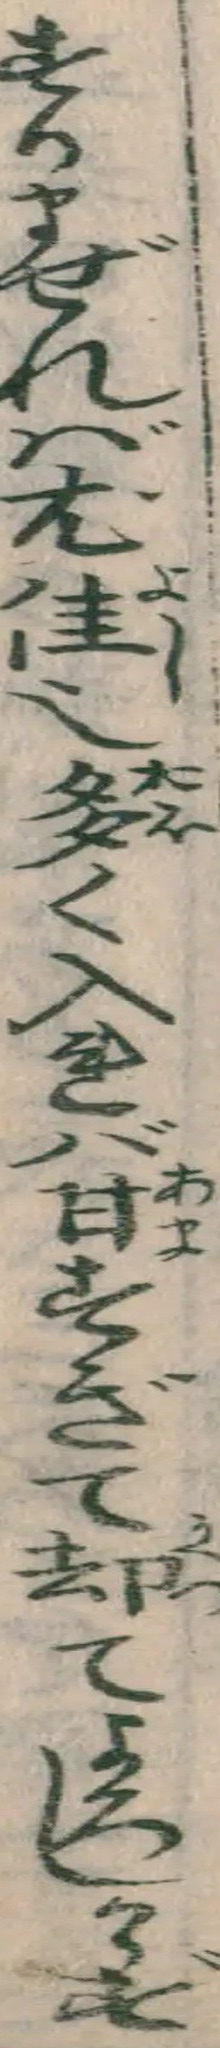すりまぜれば尤佳也多く入れば甘すぎて却てよろしからず

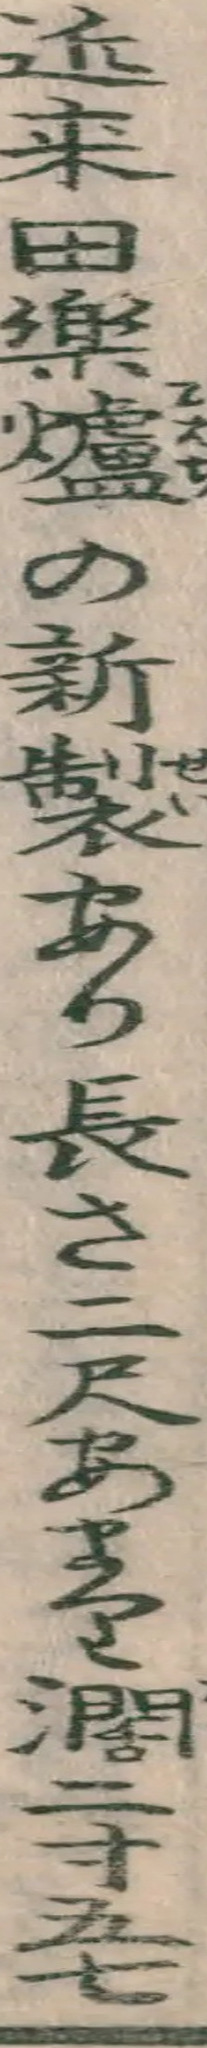近来田樂爐の新製あり長さ二尺あまり濶二寸五七
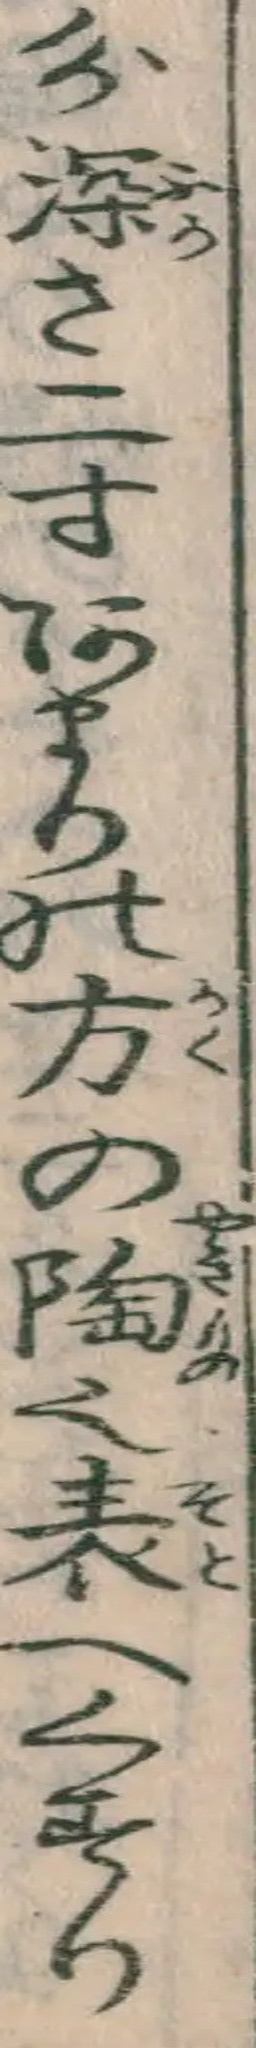分深さ二寸あまりの方の陶也表へくすり
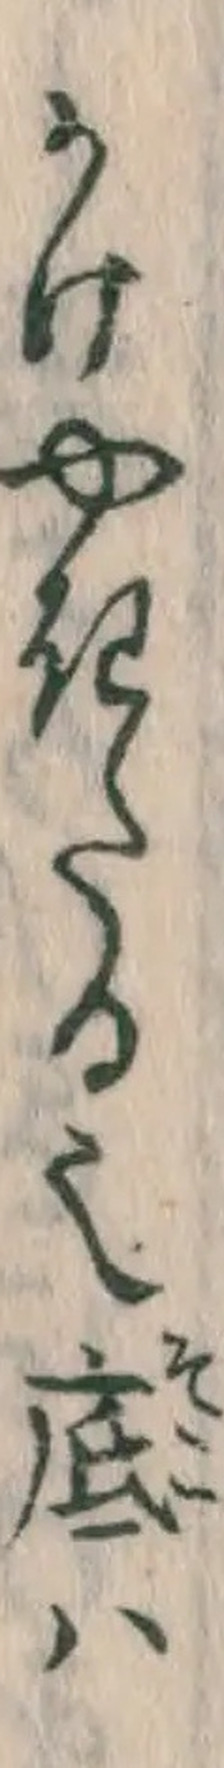かけやきたる也底は
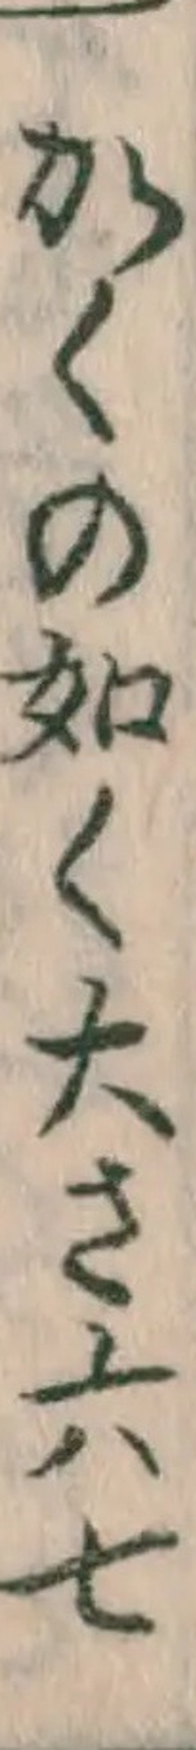かくの如く大さ六七
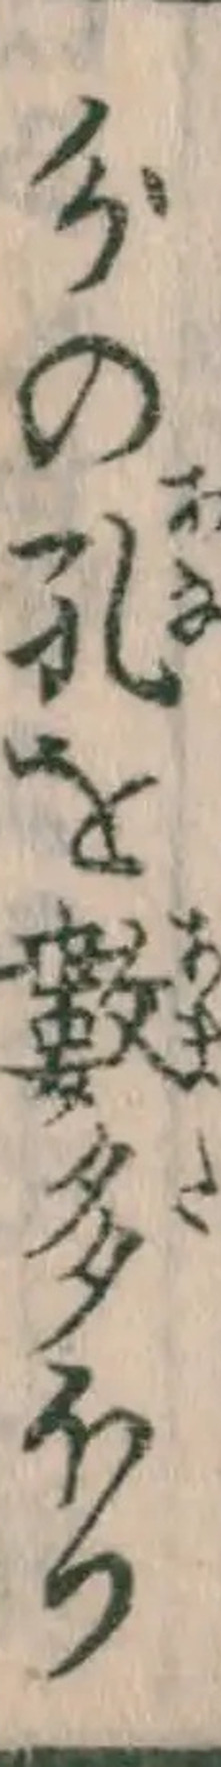分の孔を數多ほり
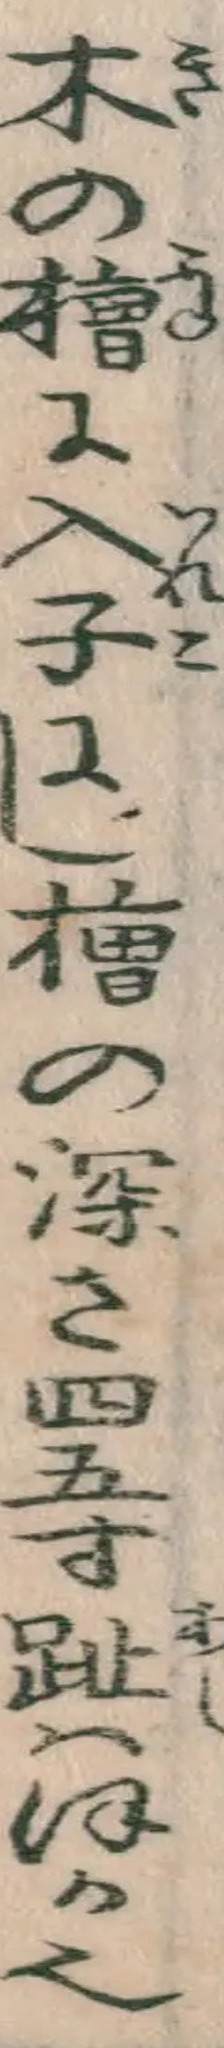木の槽に入子にし槽の深さ四五寸趾はほか也
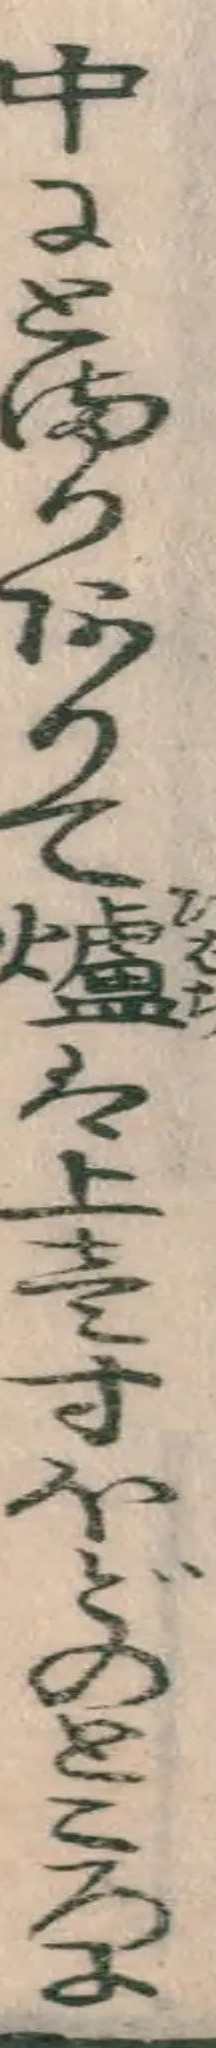中にとまりありて爐は上壱寸ほどのところに
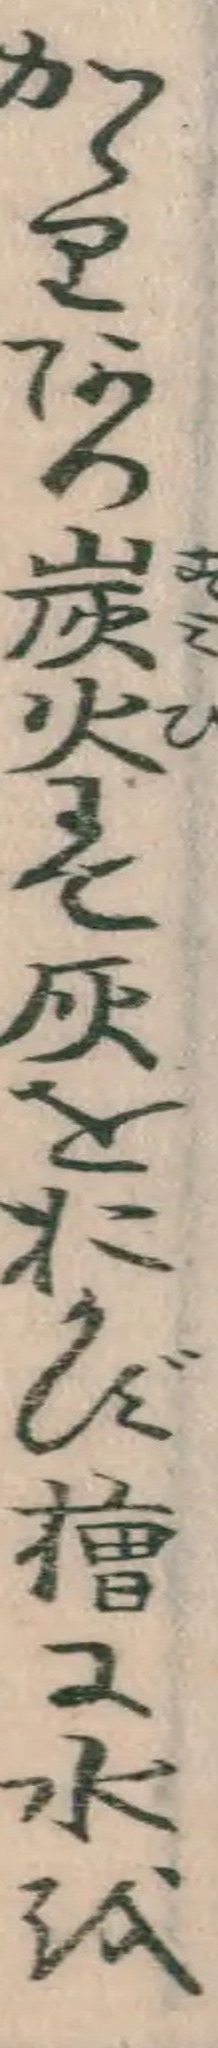かゝりあり炭火にて灰をおかず槽に水を
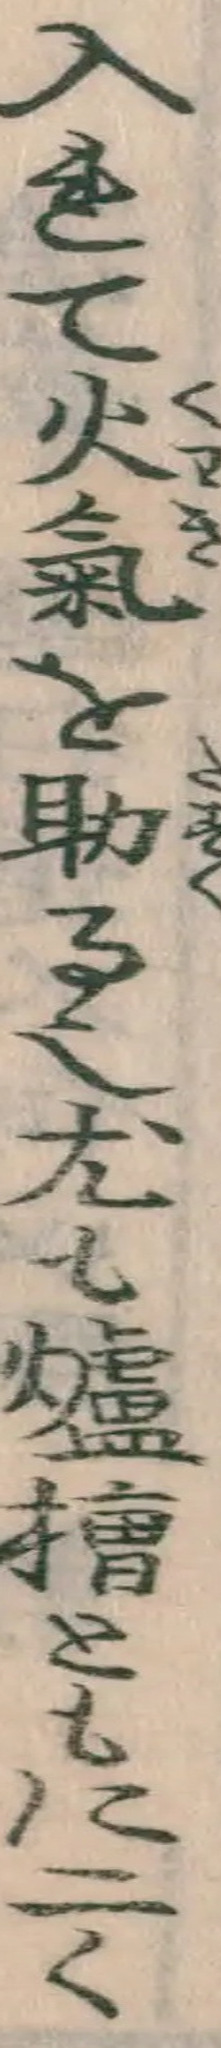入れて火氣を助る也尤も爐槽ともに二く
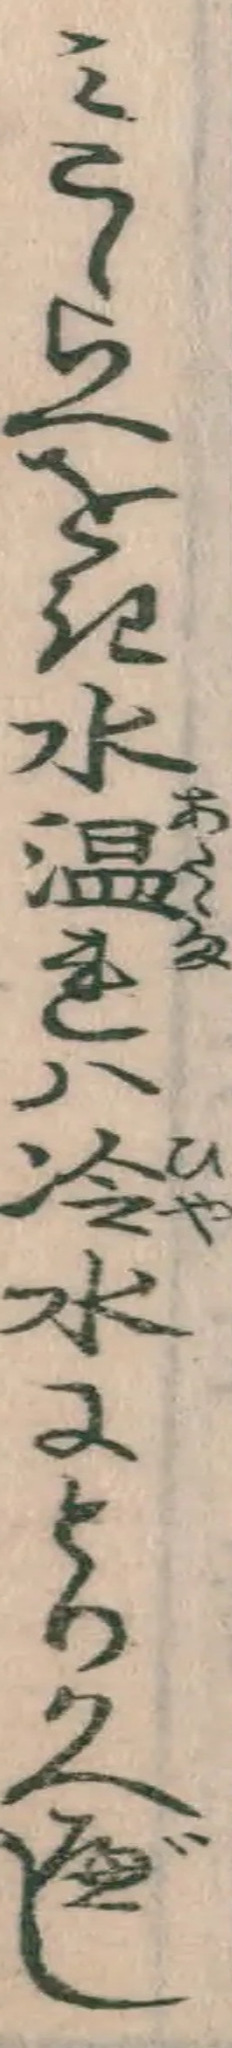みこしらへをき水温れは冷水にとりかへべし
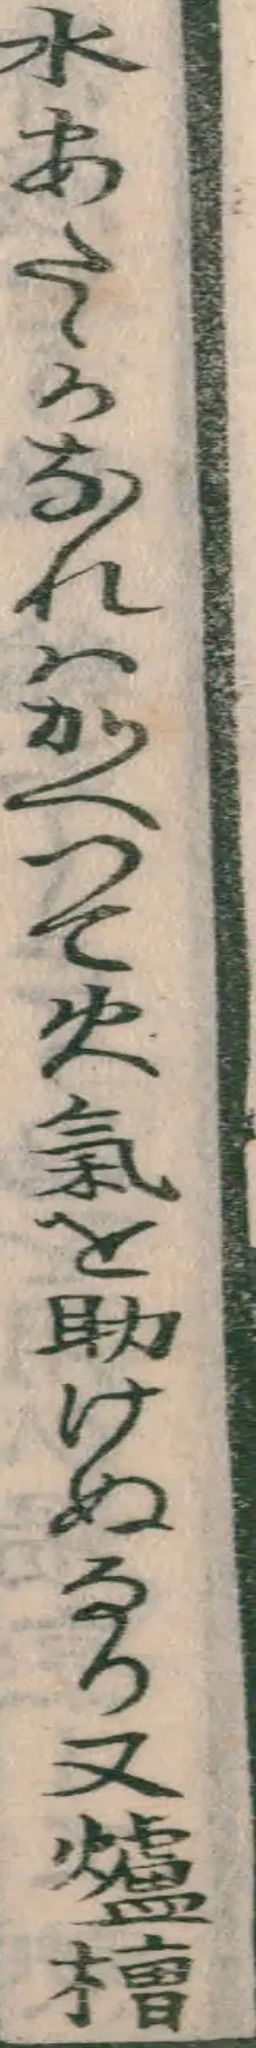水あたゝかなれはかへつて火氣を助けぬなり又爐槽
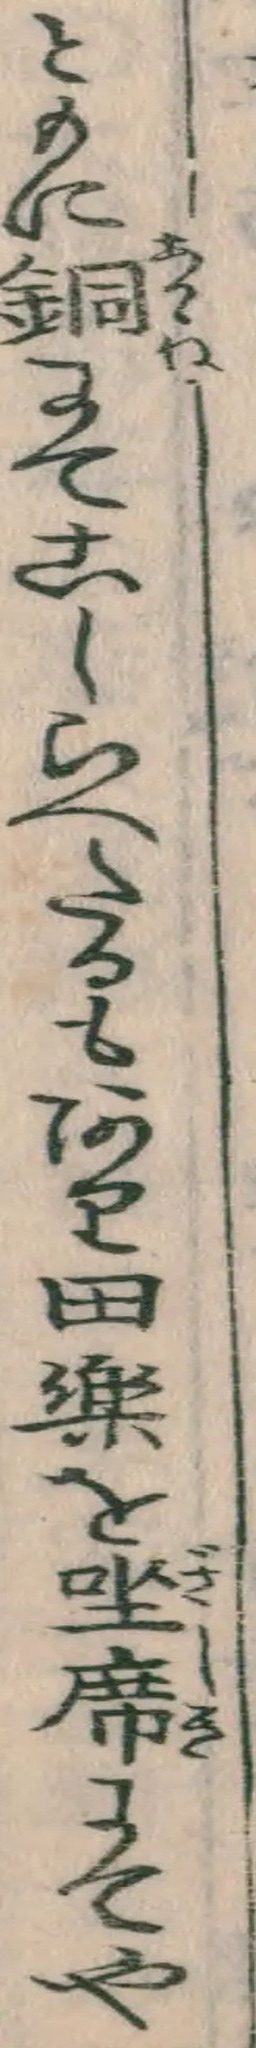ともに銅にてこしらへたるもあり田樂を坐席にてや
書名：豆腐百珍. [正編]
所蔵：国立国会図書館 National Diet Library, JAPAN
